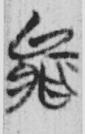能
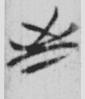至
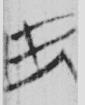𡚦（焉）
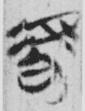○（乎）
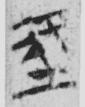○（吾）
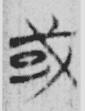或（又）
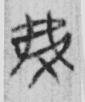弗
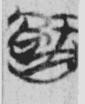智（知）
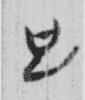也
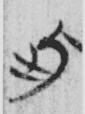此
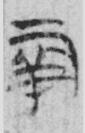兩
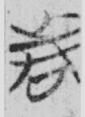者
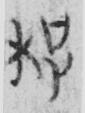枳（歧）
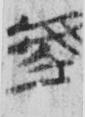○（吾）
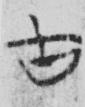古（故）
